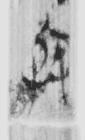兵
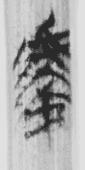{虍㚔}
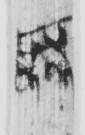聚
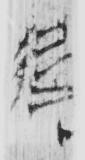起
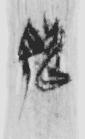{見兆}
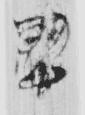{則心}
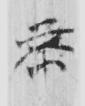不
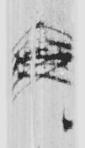爾
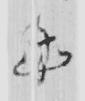忎
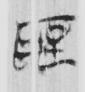聖
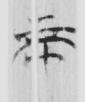不
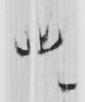出
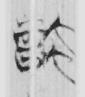{言䖵}
